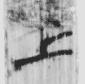上
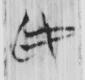女
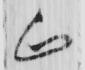㠯（以）
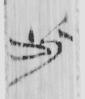此
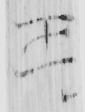臣
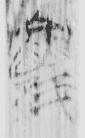雚
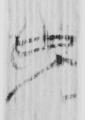𡚦
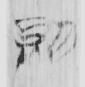則
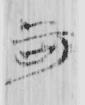可
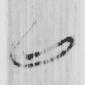㠯（以）
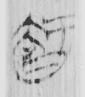智
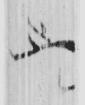之
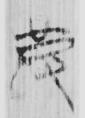皮
